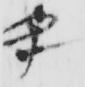丑
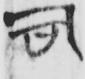司
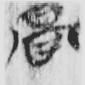晨
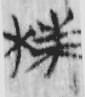株
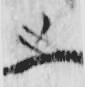之
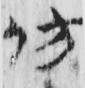仿
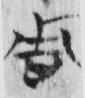周
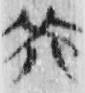癸
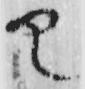巳
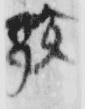郊
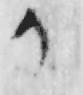人
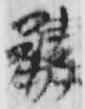雥
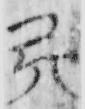己
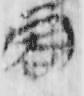丙
